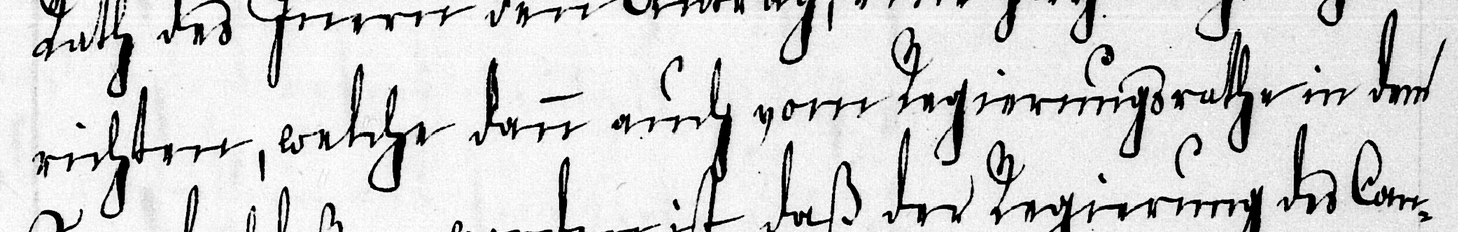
richten, welche dann auch vom Regierungsrathe in dem
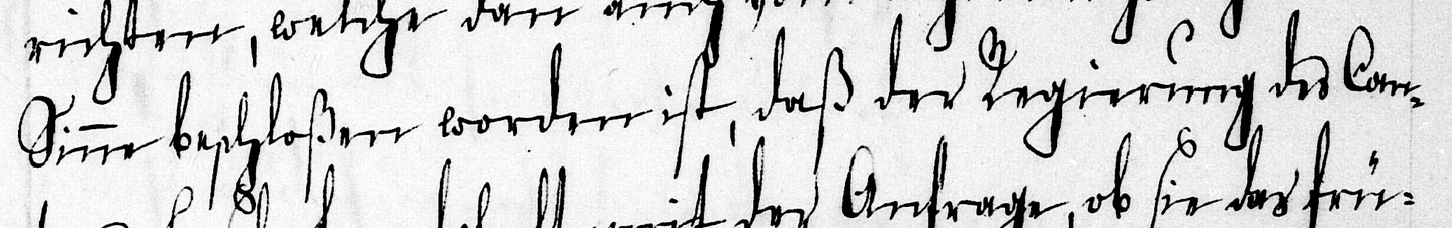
Sinne beschloßen worden ist, daß der Regierung des Can¬
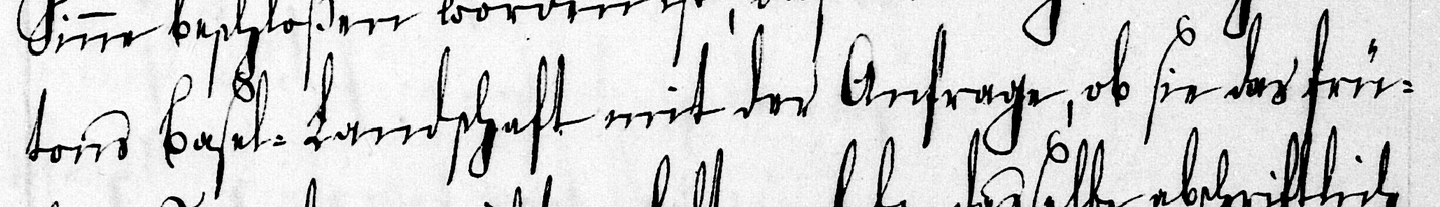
tons Basel-Landschaft mit der Anfrage, ob sie das frü¬
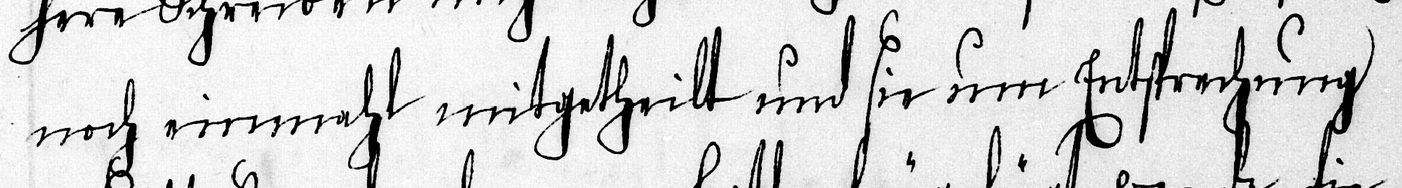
noch einmahl mitgetheilt und sie um Entsprechung
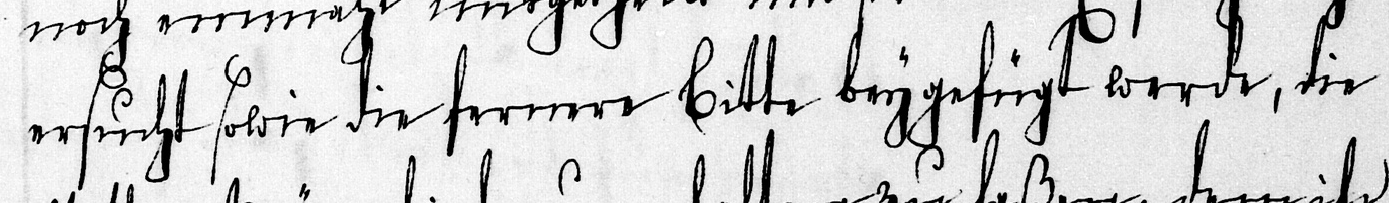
ersucht sowie die fernere Bitte beygefügt werde, die
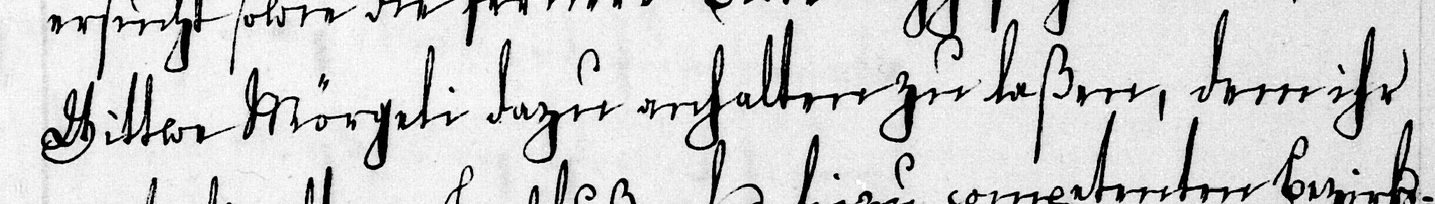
Wittwe Mörgeli dazu anhalten zu laßen, dem ihr
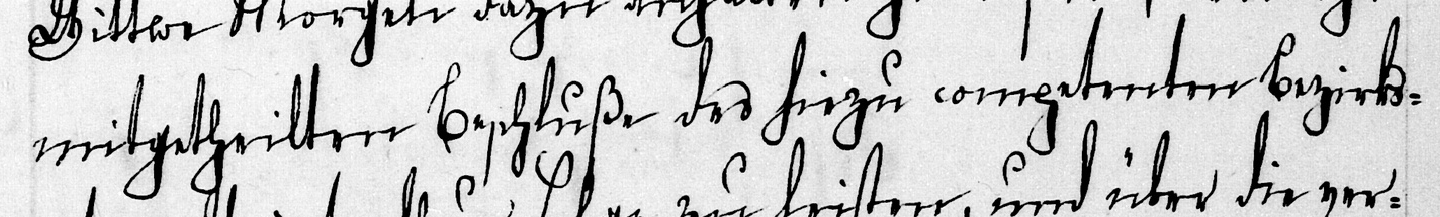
mitgetheilten Beschluße des hiezu competenten Bezirks¬
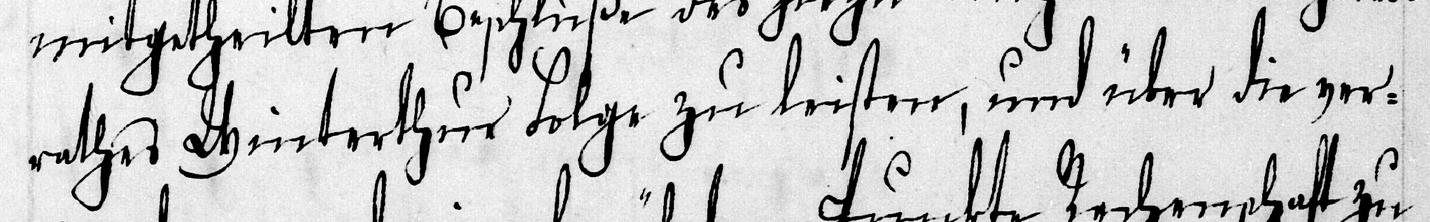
rathes Winterthur Folge zu leisten, und über die ver¬
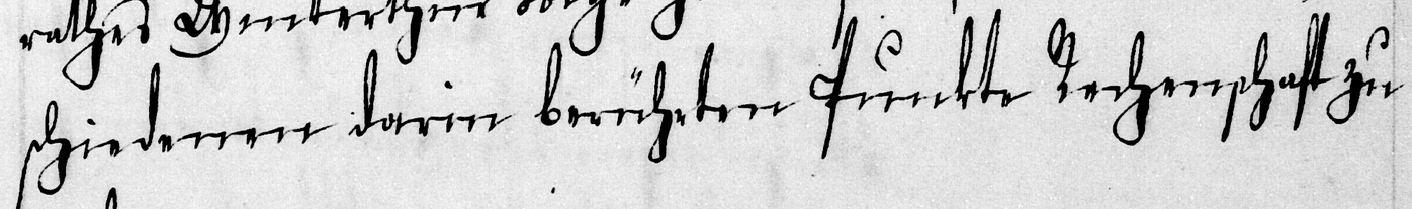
schiedenen darin berührten Punkte Rechenschaft zu
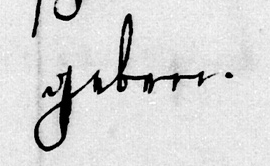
geben.
